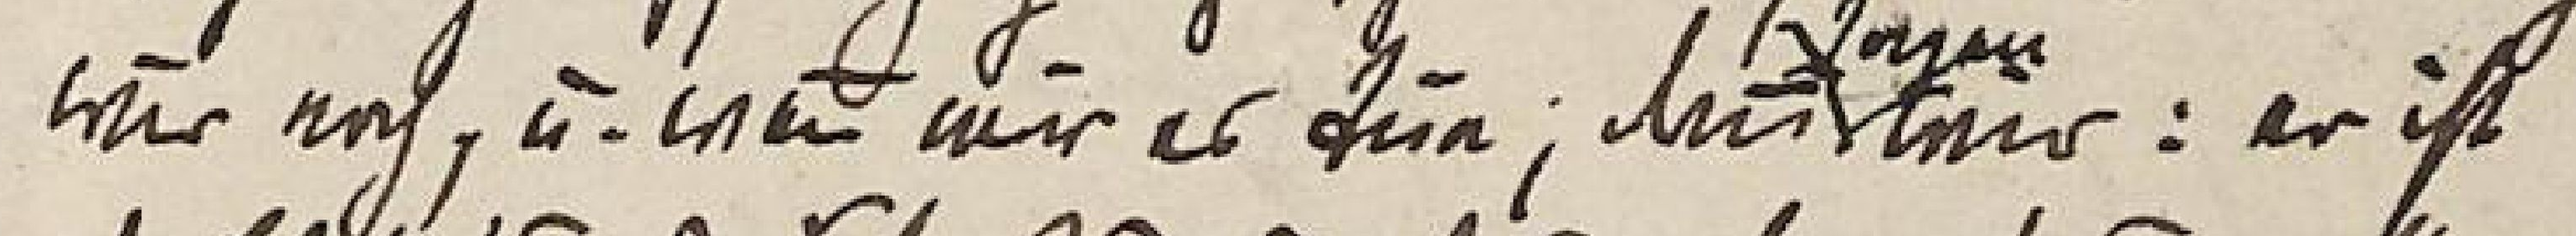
wir noch, u. wen wir es tun, dan wir: er ist
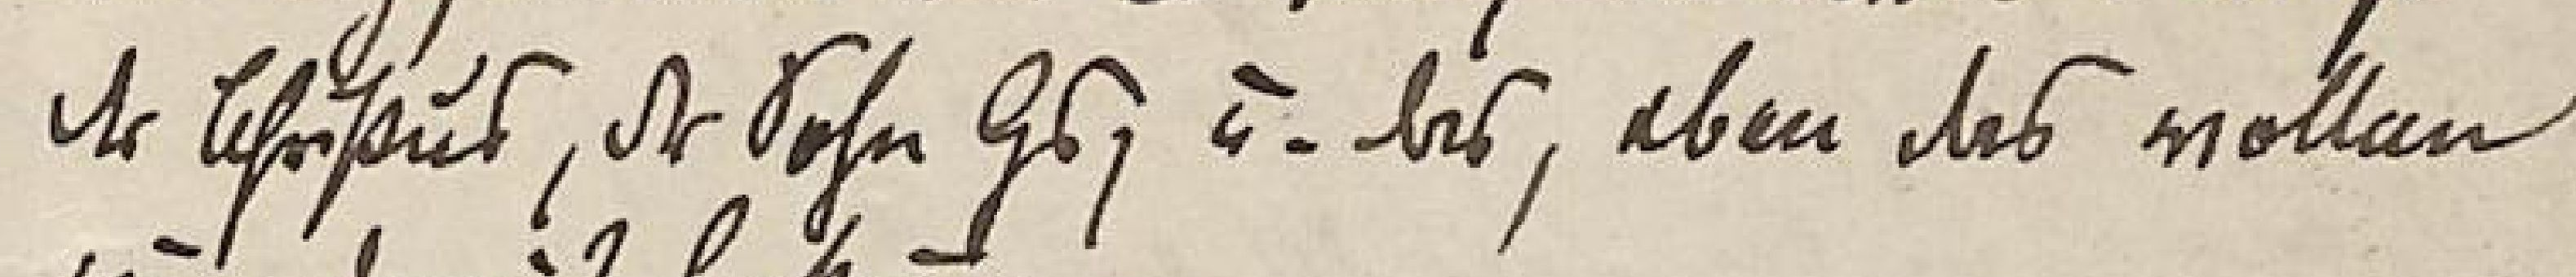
der Christus, dr Sohn Gs, u. das, eben das wollen
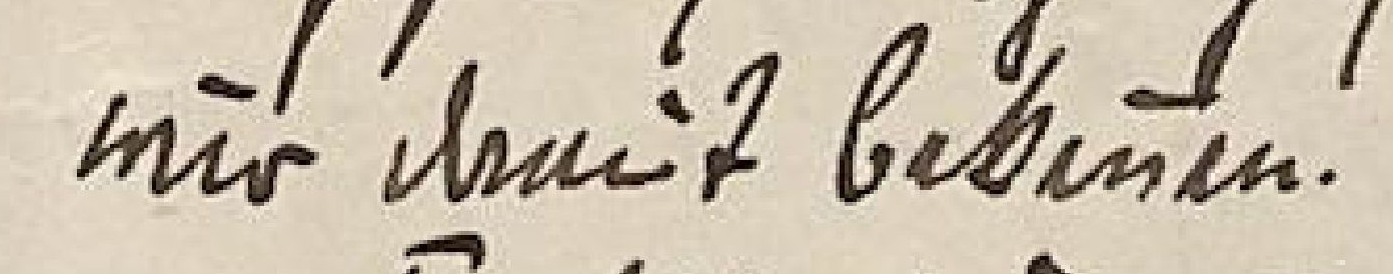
wir damit bekenen.
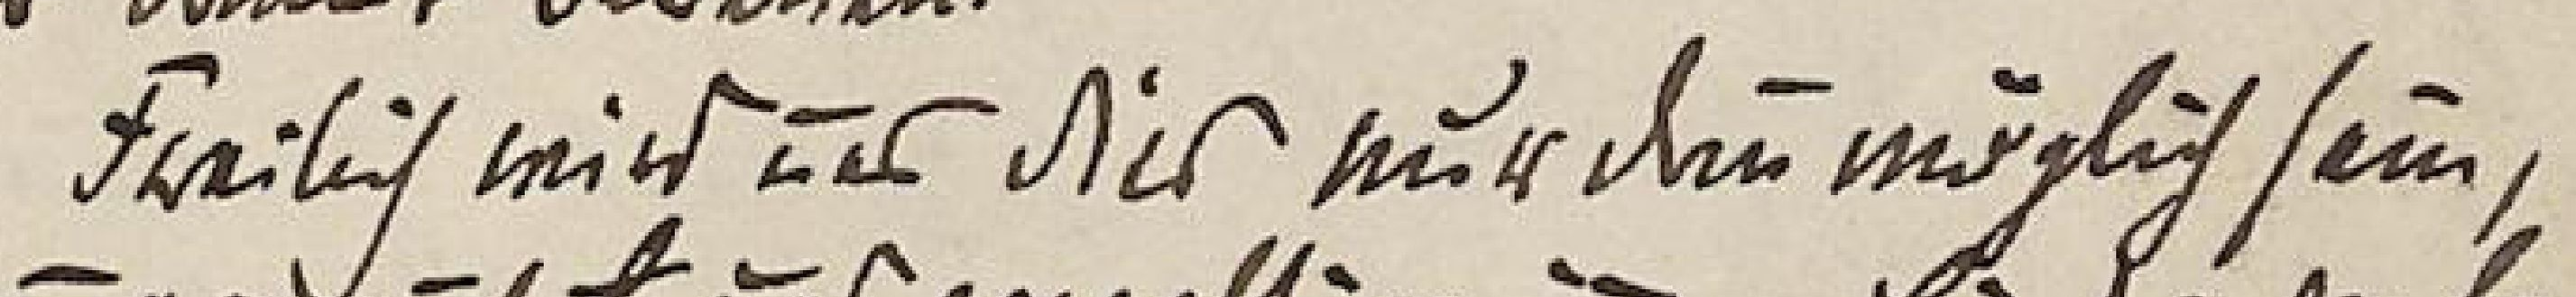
Freilich wird uns dies nur dan möglich sein,
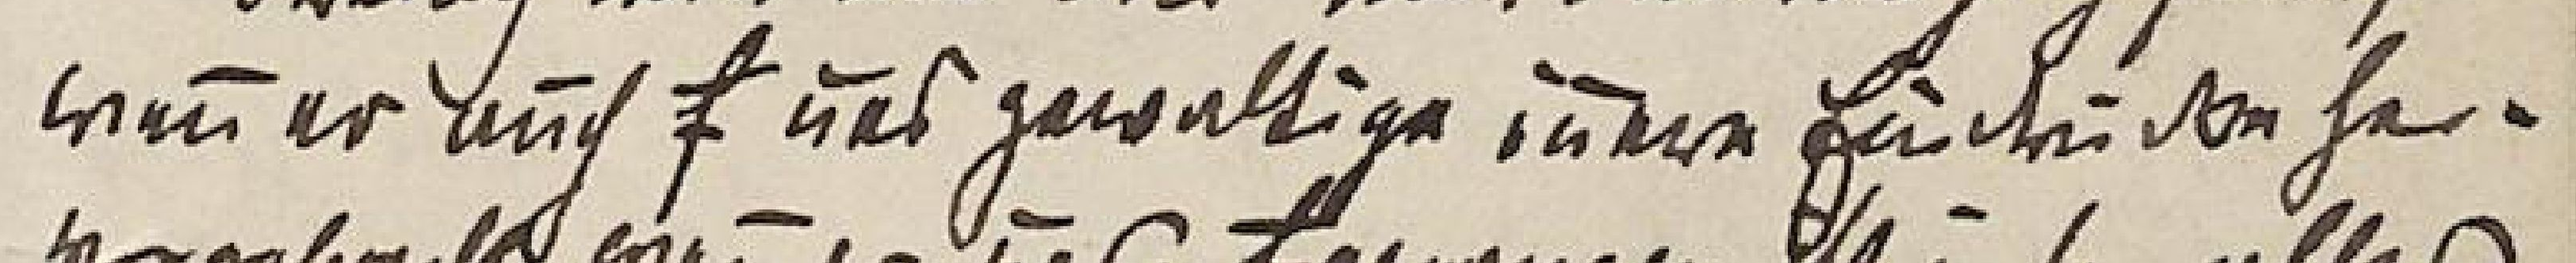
wen er auch f uns gewaltige inere Eindrücke her¬
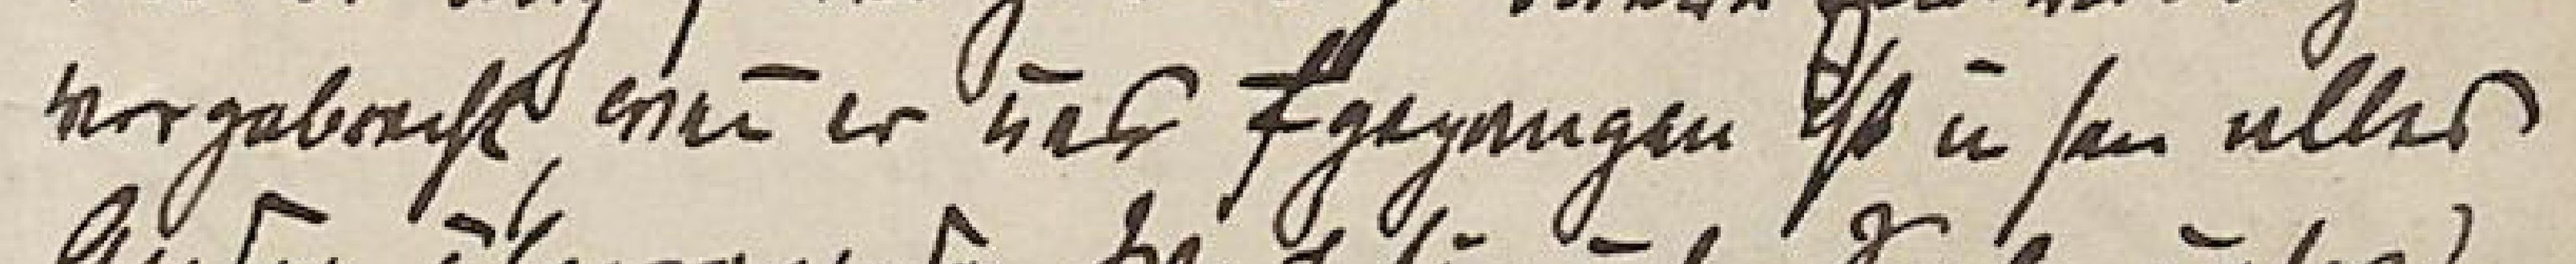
vorgebracht, wen er uns f gegangen ist in sm alles
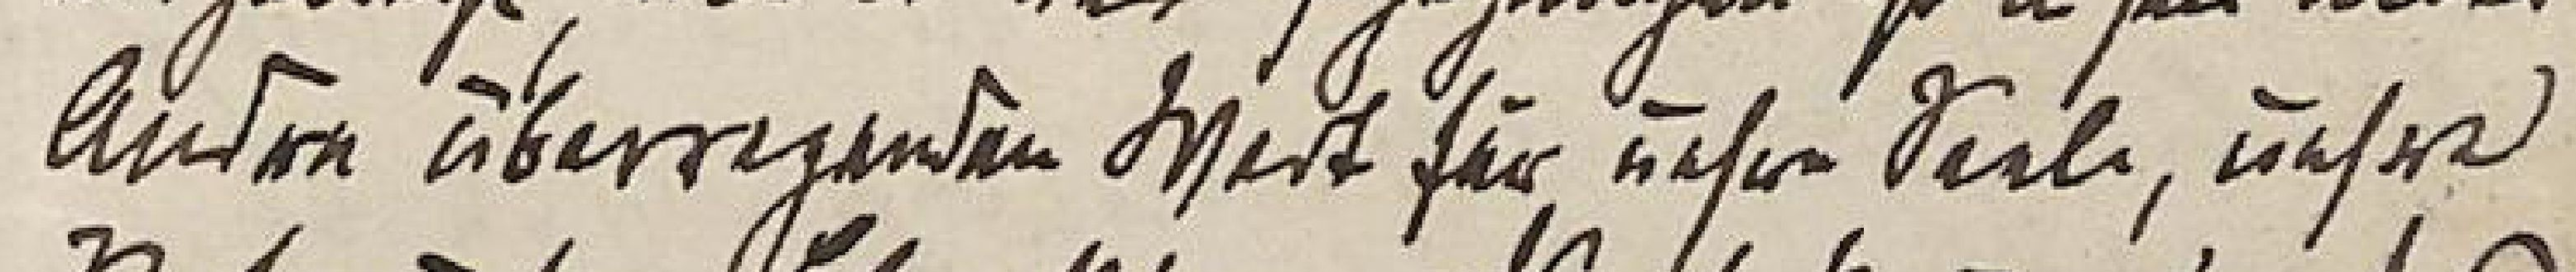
Andre überragenden Wert für unsre Seele, unsre
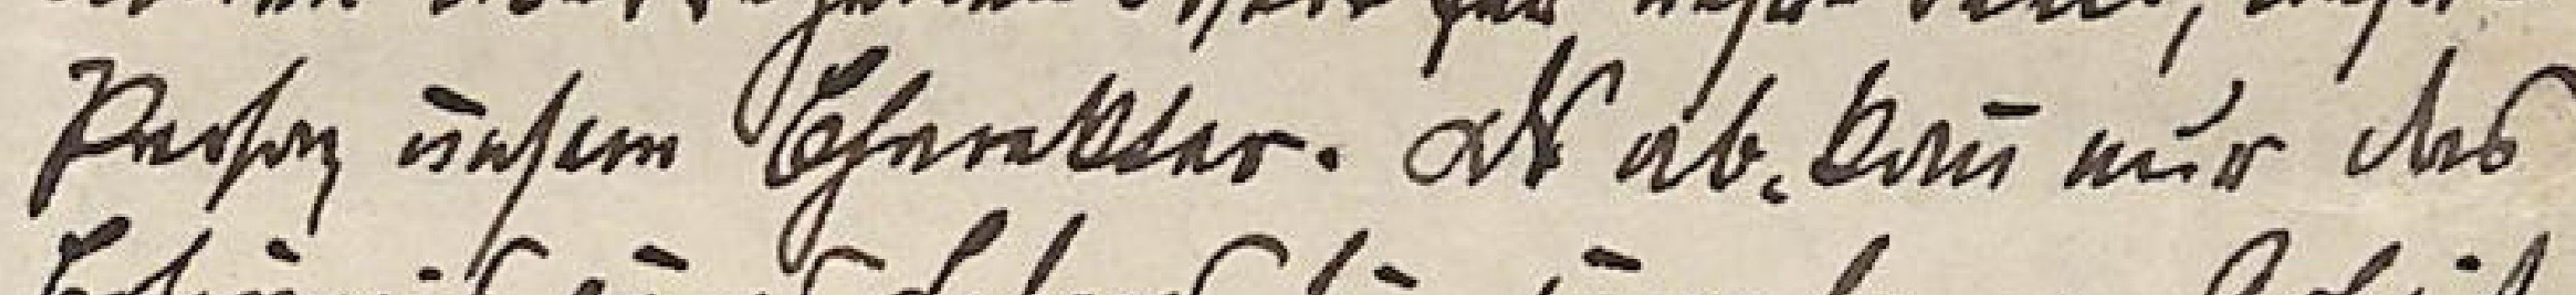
Person, unserm Charakter. Das ab kan nur das
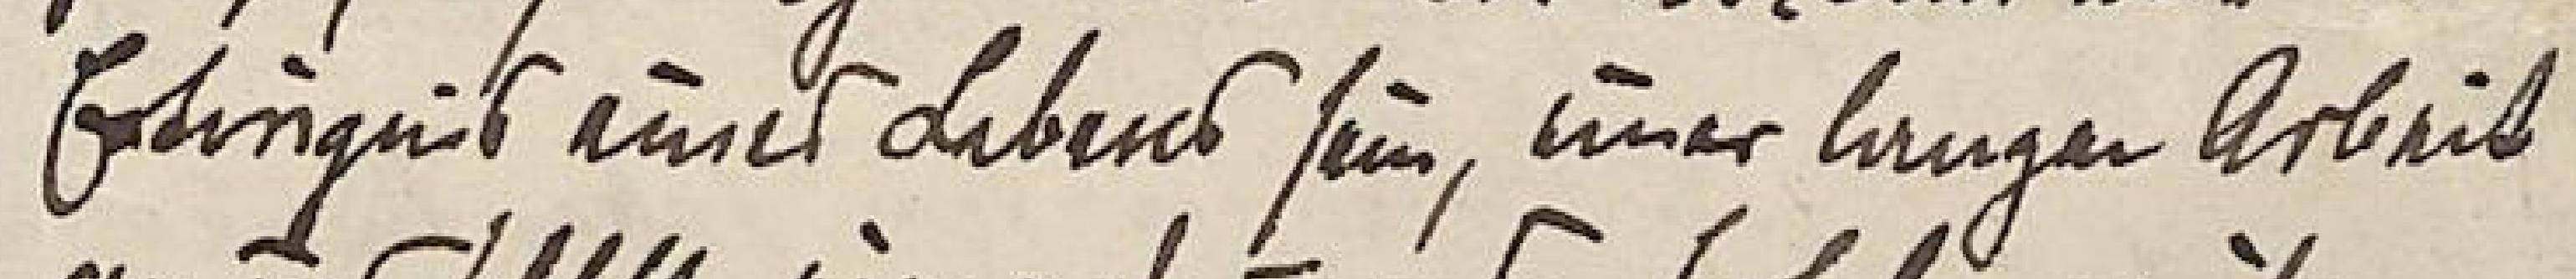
Bedingnis eines Lebens sein, einer langen Arbeit
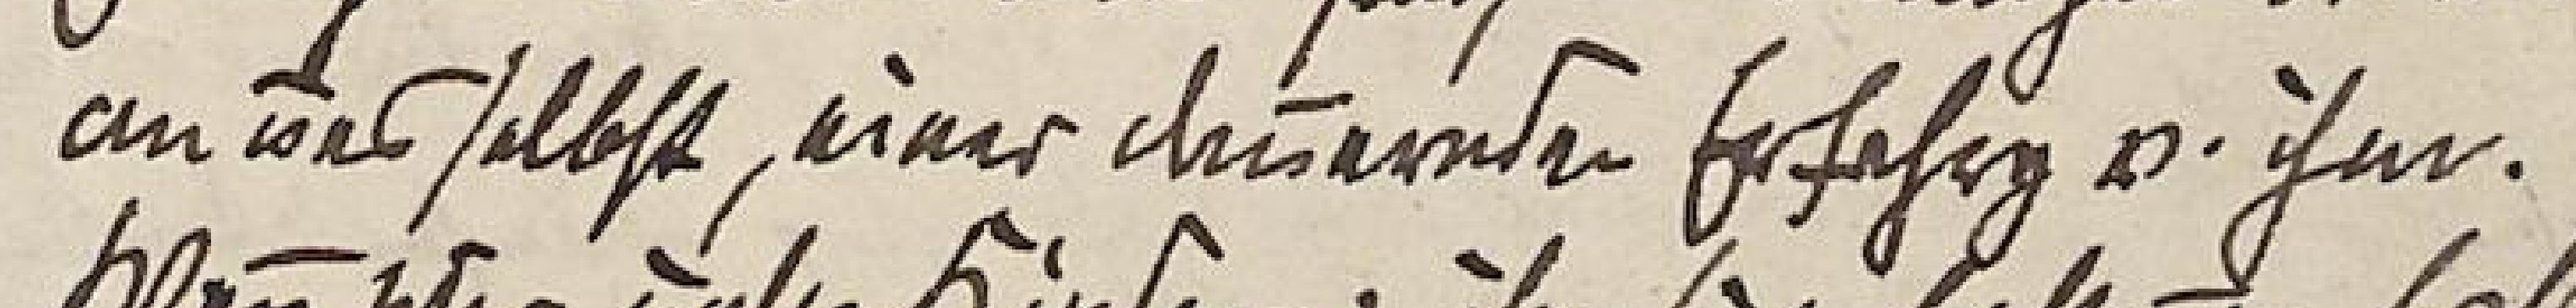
an uns selbst, einer dauernden Erfahrg v. ihm
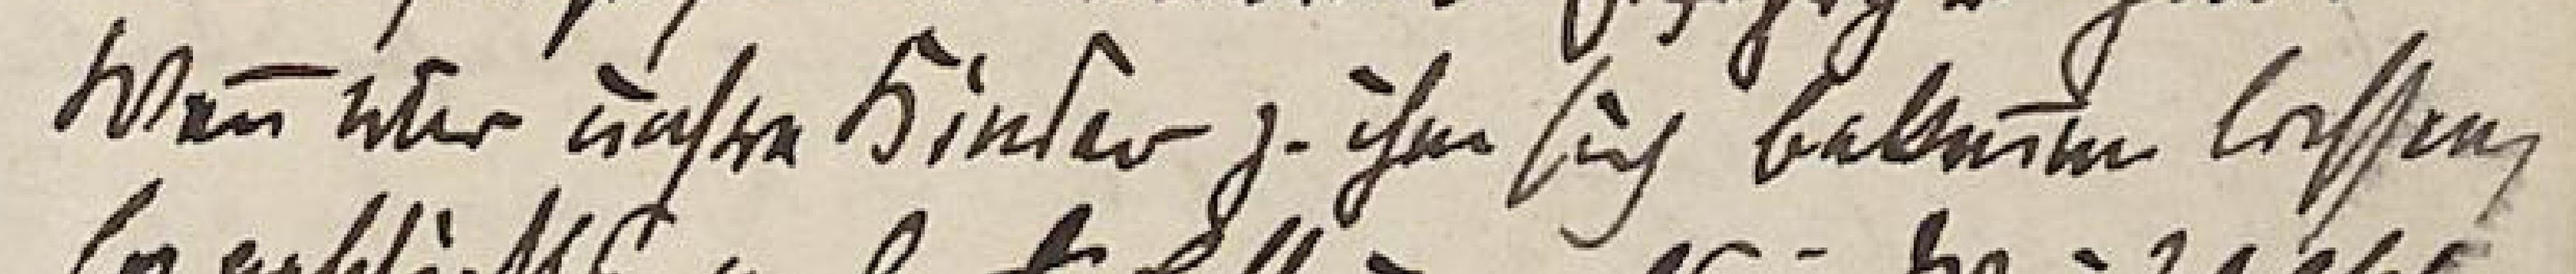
Wen wir unsre Kinder z. ihm sich bekenen lassen,
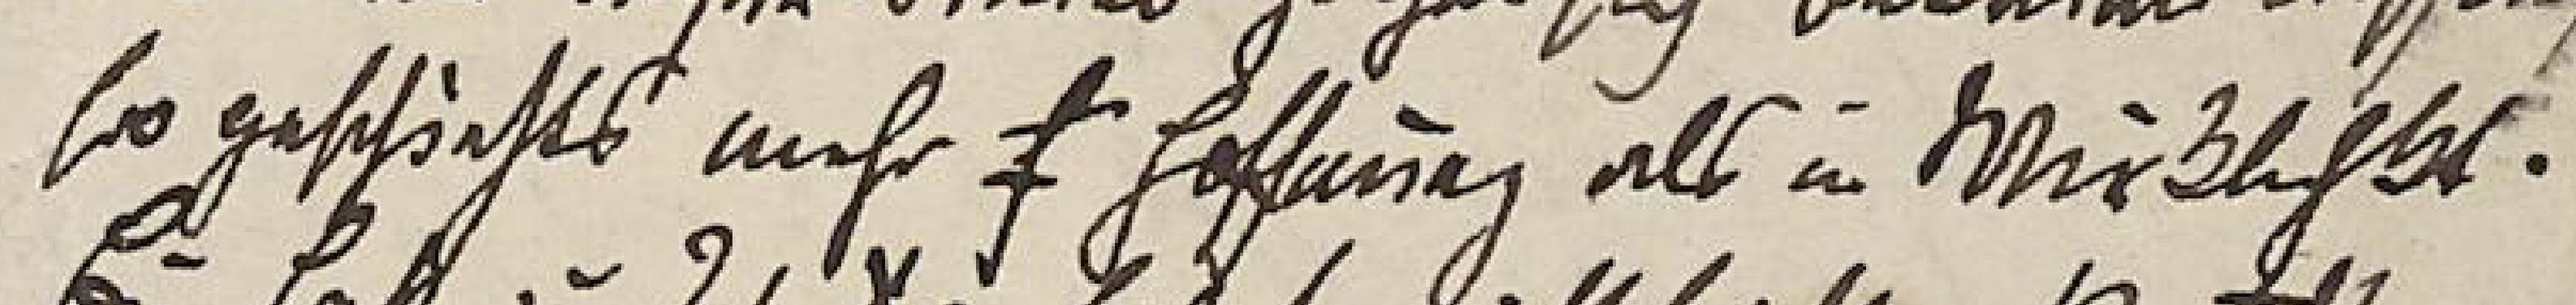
so geschiehts mehr f Hoffnung als in Wirklichkt.
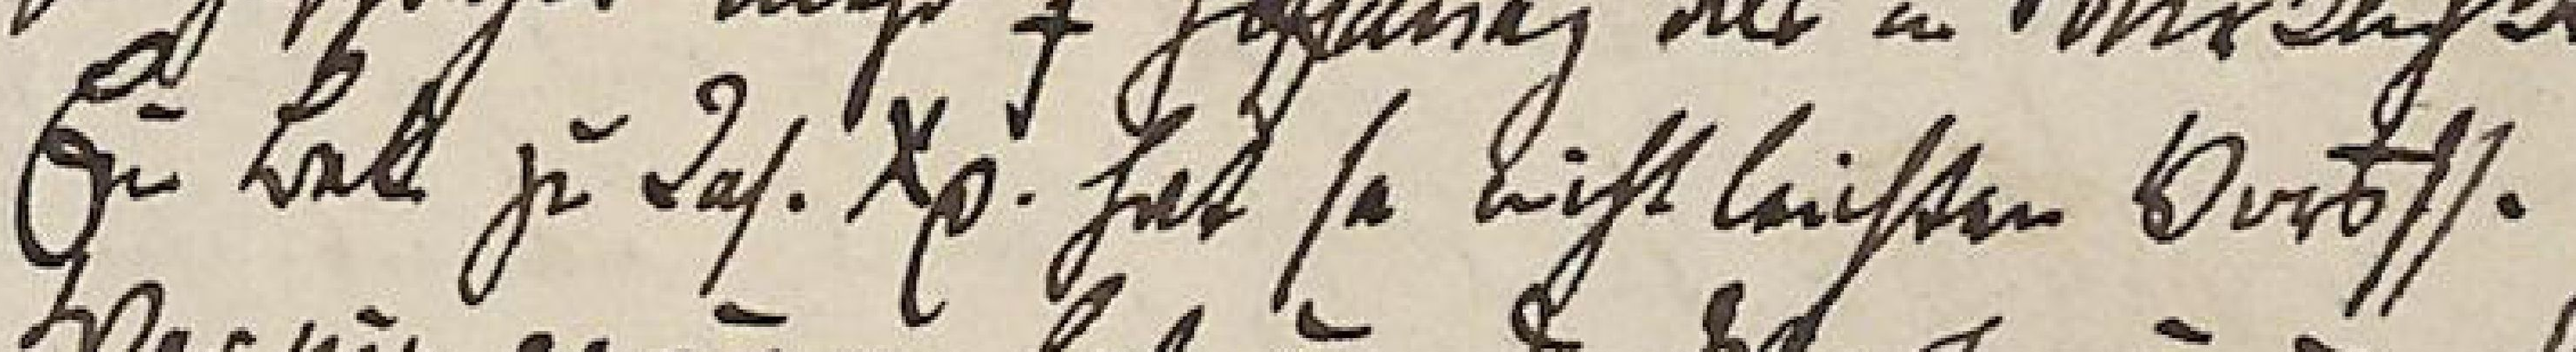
Ein Bek. zu Jes. Χρ hat sn nicht leichten Vorsss.
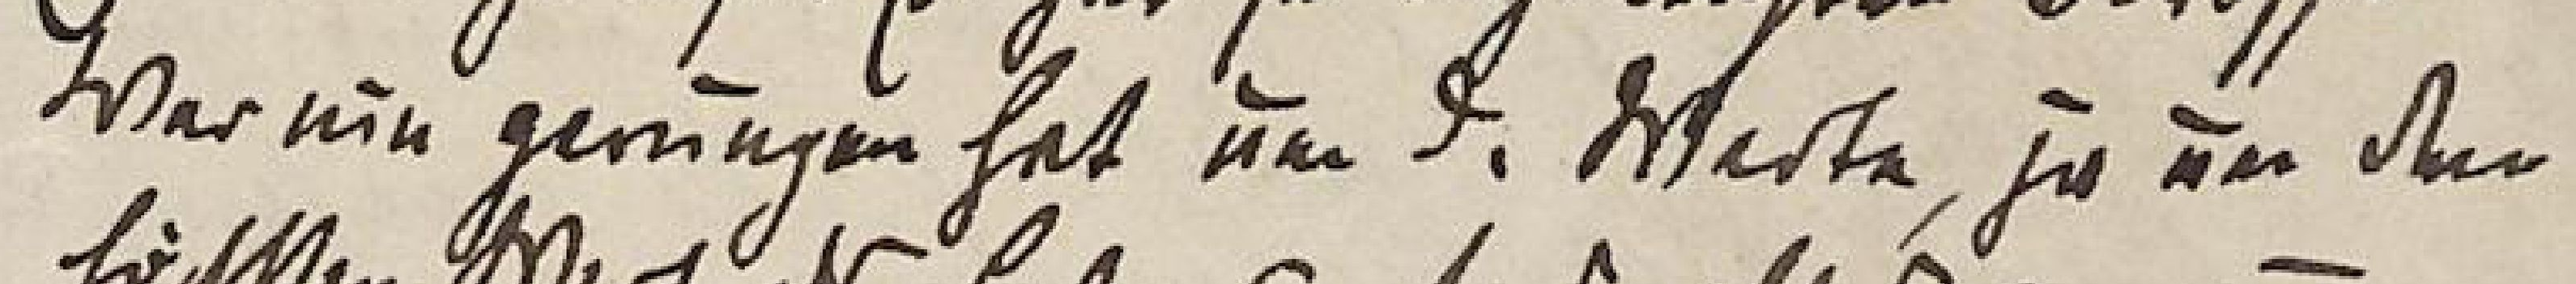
Wer nie gerungen hat um d. Wert, ja um den
